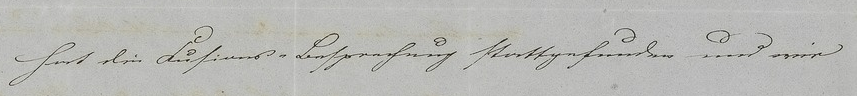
hat die Fusions-Besprechung stattgefunden und wir
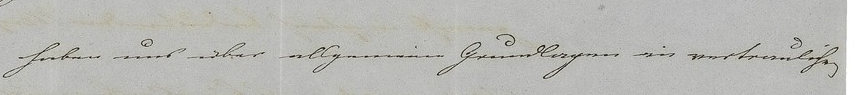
haben uns über allgemeine Grundlagen in vertraulicher
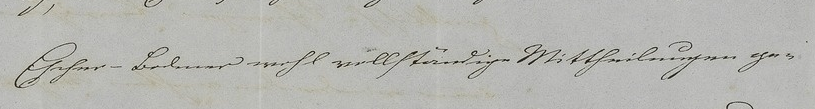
Escher-Bodmer wohl vollständige Mittheilungen ge-
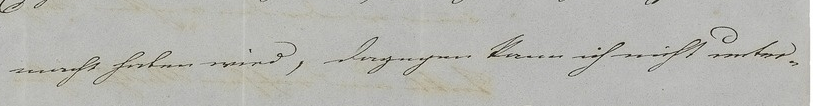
macht haben wird, dagegen kann ich nicht unter-
